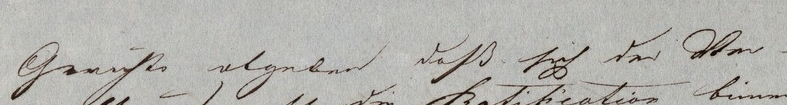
Gerichte abgeben daß sich der Ver-
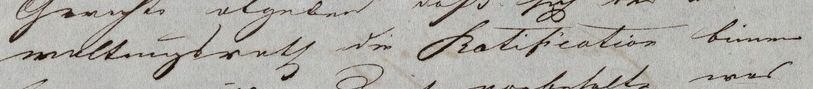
waltungsrath die Ratification binnen
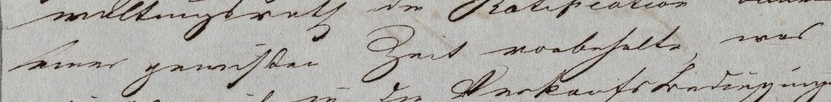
einer gewissen Zeit vorbehalte, was
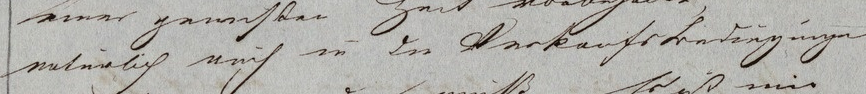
natürlich auch in die Verkaufs Bedingungen
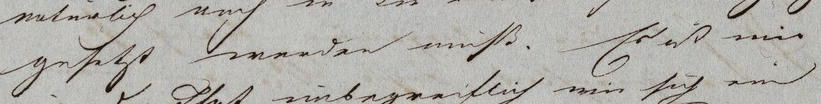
gesetzt werden muß. Es ist mir
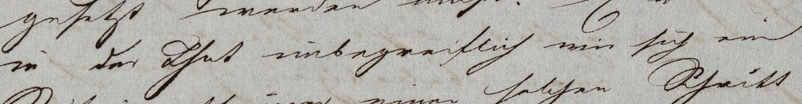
in der That unbegreiflich wie sich ein
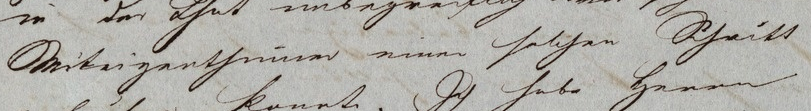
Miteigenthümer einen solchen Schritt
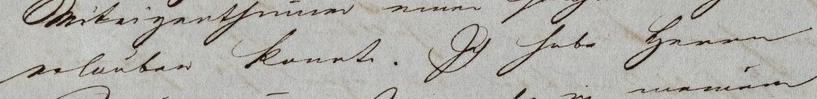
erlauben konnte. Ich habe Herrn
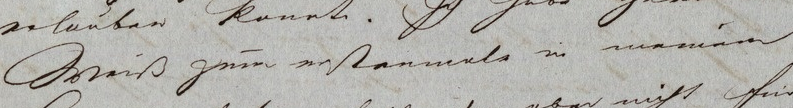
Weiß zum erstenmale in meinem
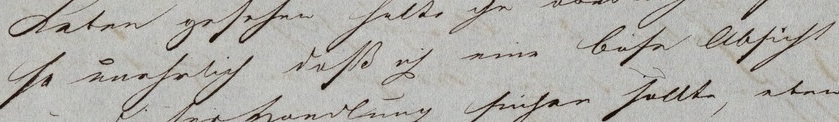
so unehrlich daß ich eine böse Absicht
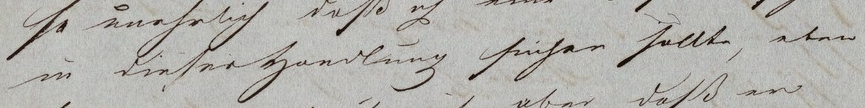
in dieser Handlung suchen sollte, eben
